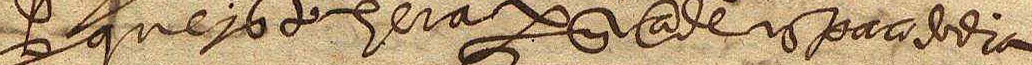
e que jsto hera ꝑ grāde espaco do dia
